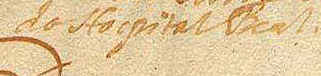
do Hospital Real.
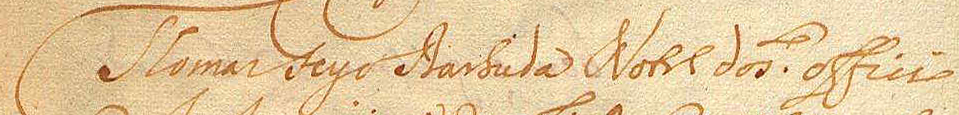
Thomas Feyo Barbuda Notr.o do s.to officio
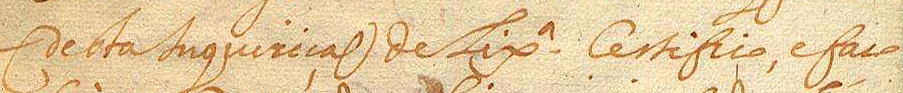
desta Inquiziçaꝭ de Lix.a Certifico, e faço
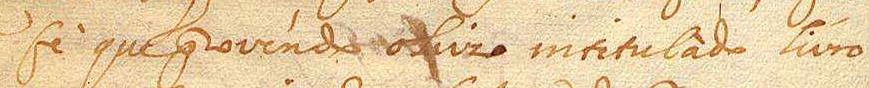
fe que provendo o livro intitulado livro
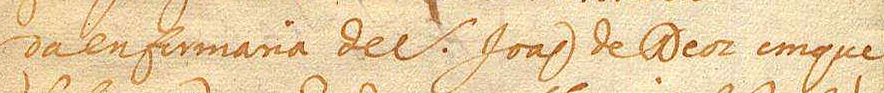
da enfermaria de S. Joaõ de Deoz em que
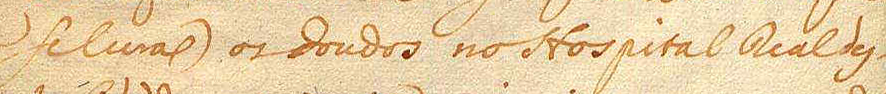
se curaꝭ os doudos no Hospital Real des
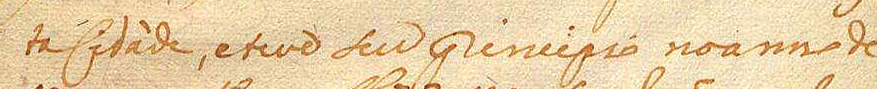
ta Cidade, e teve seu principio no anno de
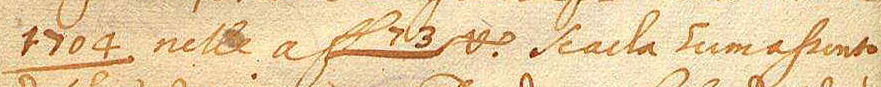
1704 nelle a fl 73 Ꝟ.o Se acha hum assento
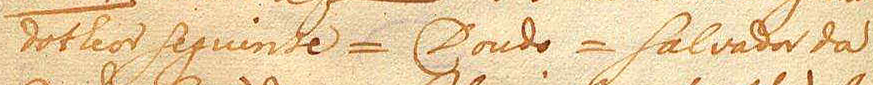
do theor seguinte = Doudo = Salvador da
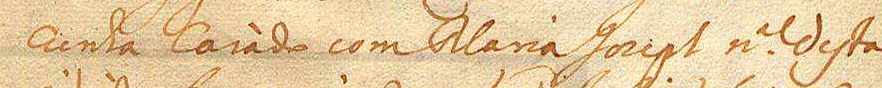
cunha Cazado com Maria Jozeph n.al desta
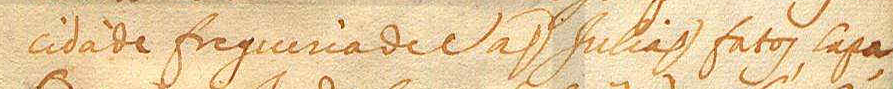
cidade freguesia de Saꝭ Juliaꝭ fatos, capa,
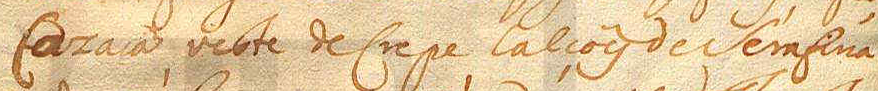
Cazaca, veste de Crepe calçoẽs de Serafina
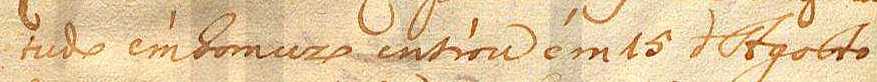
tudo em bom uzo entrou em 15 d̄ Agosto
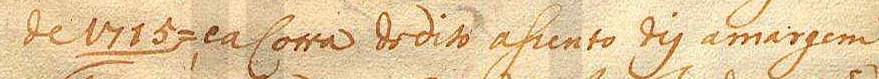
de 1715 =, e a Costa do dito assento dis a margem
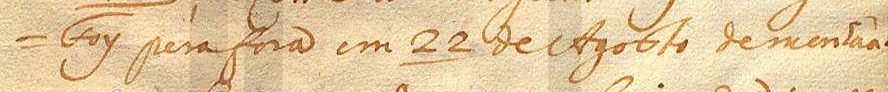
= Foy pera fora em 22 de Agosto de menhaā.
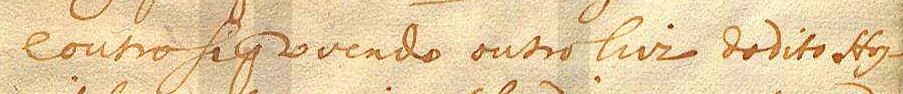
e outrosi provendo outro livro do dito Hos
